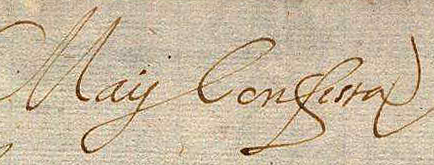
Mais Confissaõ
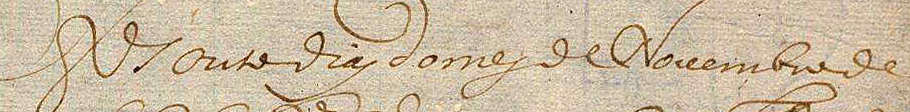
Aos outo dias do mes de Nouembro de
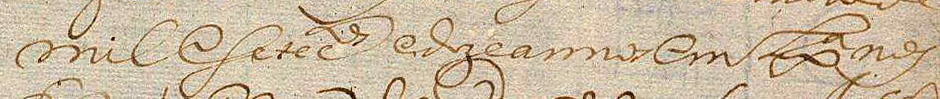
mil E setectos e doze annos em Lxa nos
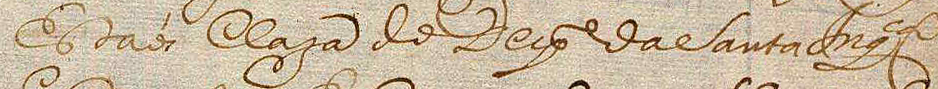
Estaós E Caza do Desp.o da Santa Inq.caꝭ
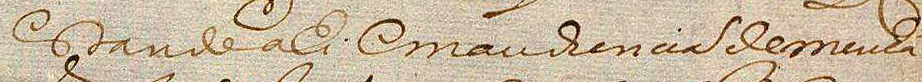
Estando ahi Em audiencia de menhã
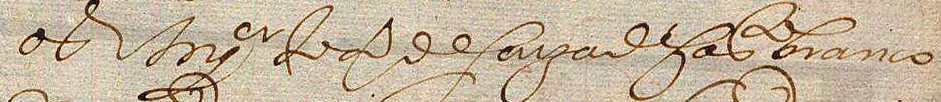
o sr Inqor Ioaꝭ de souza de Casto branco
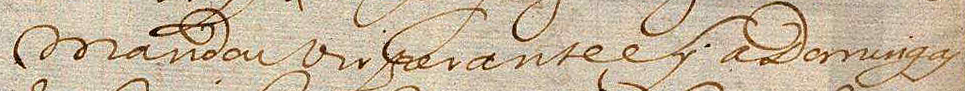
mandou vir perante Sy a Domingas
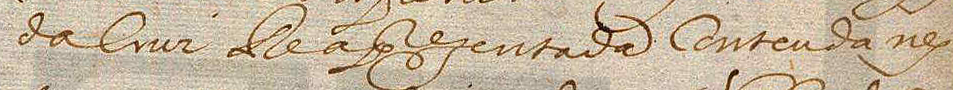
da Cruz Re apRezentada Conteuda nes
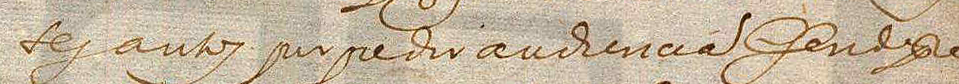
tes autos por pedir audiencia E sendo pRe
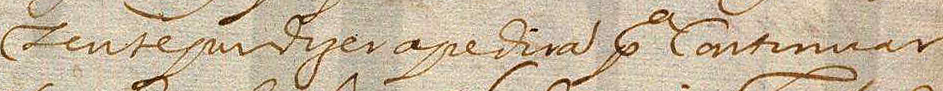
zente por dizer a pedira pa Continuar
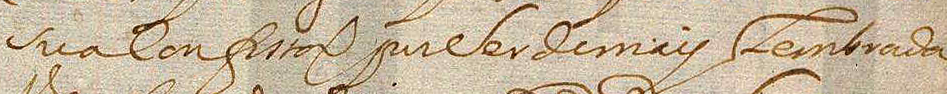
sua confissaꝭ por Ser de mais Lembrada
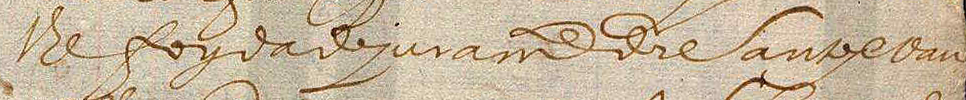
lhe foy dado juramto dos Santos evan
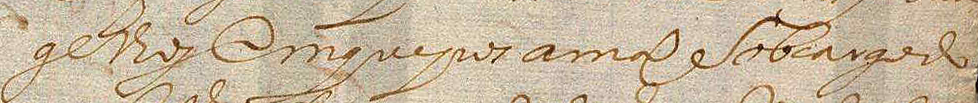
gelhos em que pos a maꝭ Sob cargo do
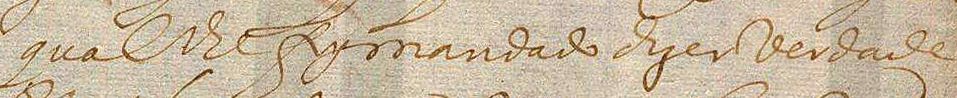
qual lhe foy mandado dizer verdade
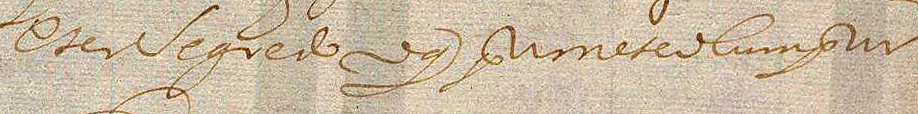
e ter segredo o q̄ pRometeo CumpRir
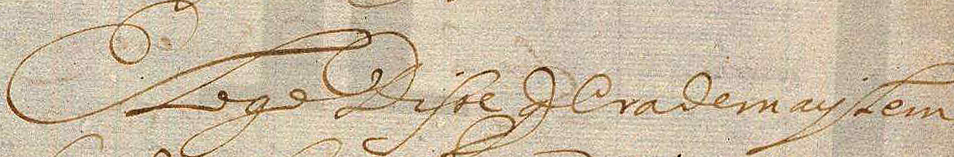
E Logo Disse q̄ era de mais Lem
